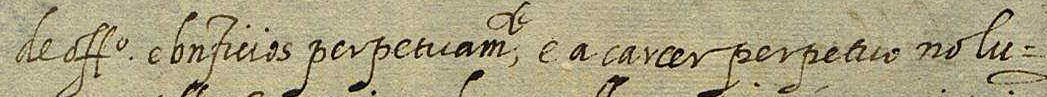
de offo. e bn̄ficios perpetuamte, e a carcer perpetuo no lu
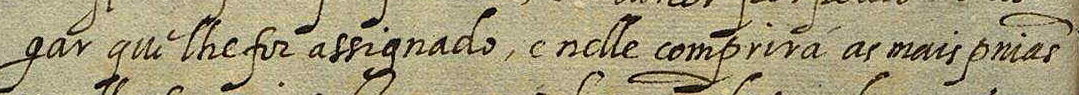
gar que lhe for assignado, e nelle comprirá as mais pn̄ias
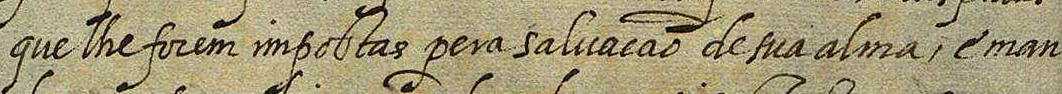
que lhe forem impostas pera saluação de sua alma, e man
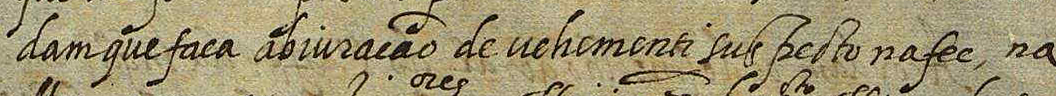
dam que faça abiuração de uehementi suspecto na fee, na
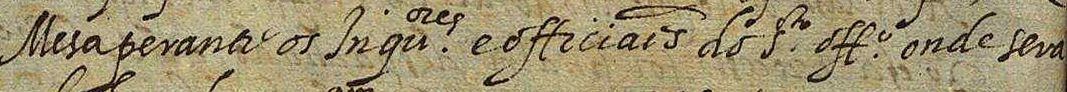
Mesa perante os Inquores. e officiāes do scto. off.o onde sera
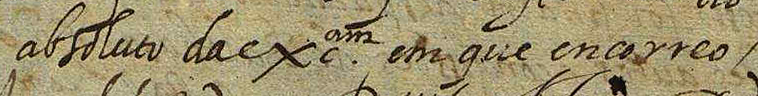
absoluto da exc.am em que encorreo /
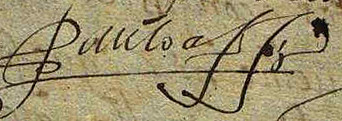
Paulo afōso
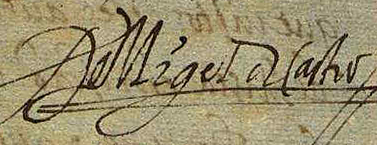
Dō Migel d̄ Castro
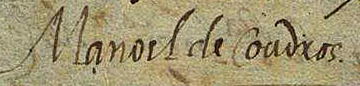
Manoel de Coadros
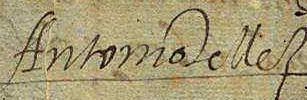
Antonio tellez
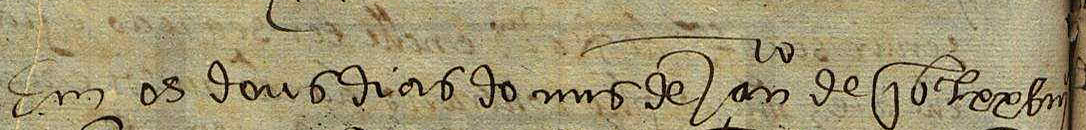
Em os dous dias do mes de Janro de j̄ bcLxxbiij
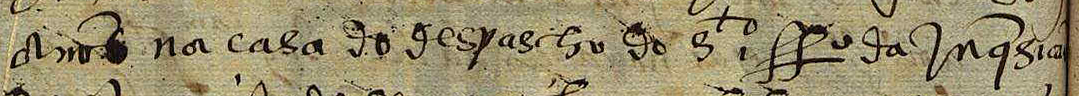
Anōs na casa do despacho do sto. offo da Jnq̄siçã
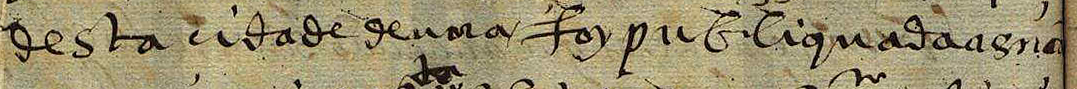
desta cidade deuora / foy publiquada a snç
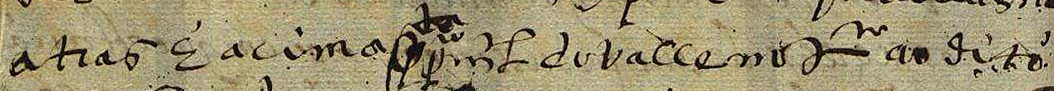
atras E acima p̄ta p̄o meL do valle notro ao dito
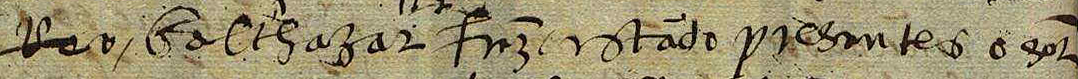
Reo / balthazar frz̄ / estādo presentes o sōr
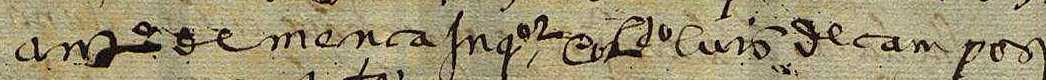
anto de mença Jnqor, e o Ldo luis de campos
